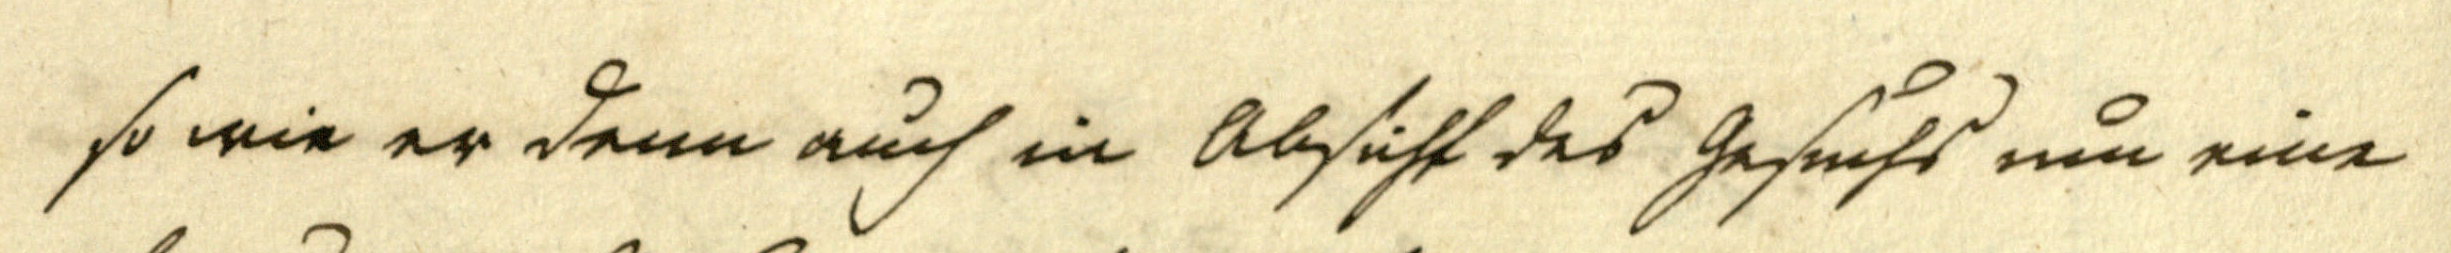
so wie er denn auch in Absicht des Gesuchs um eine
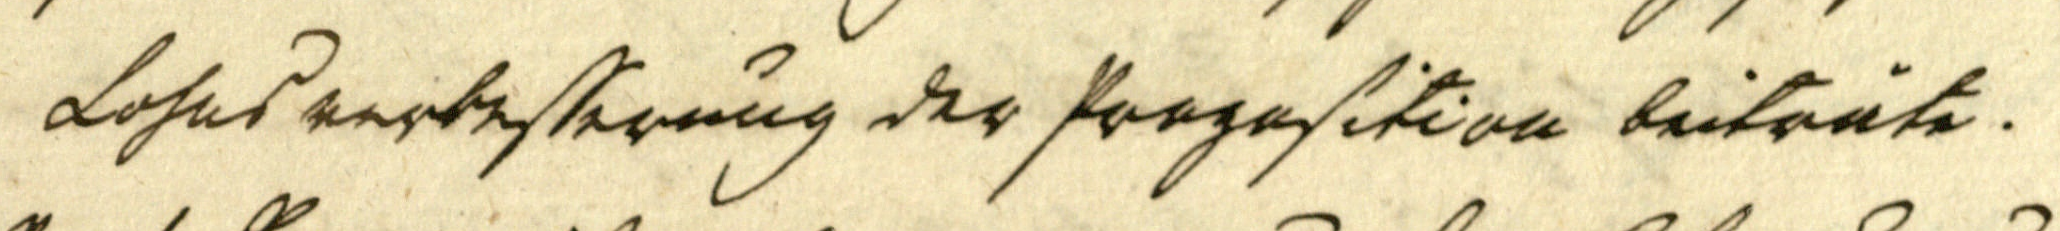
Lohns verbesserung der Proposition beiträte.
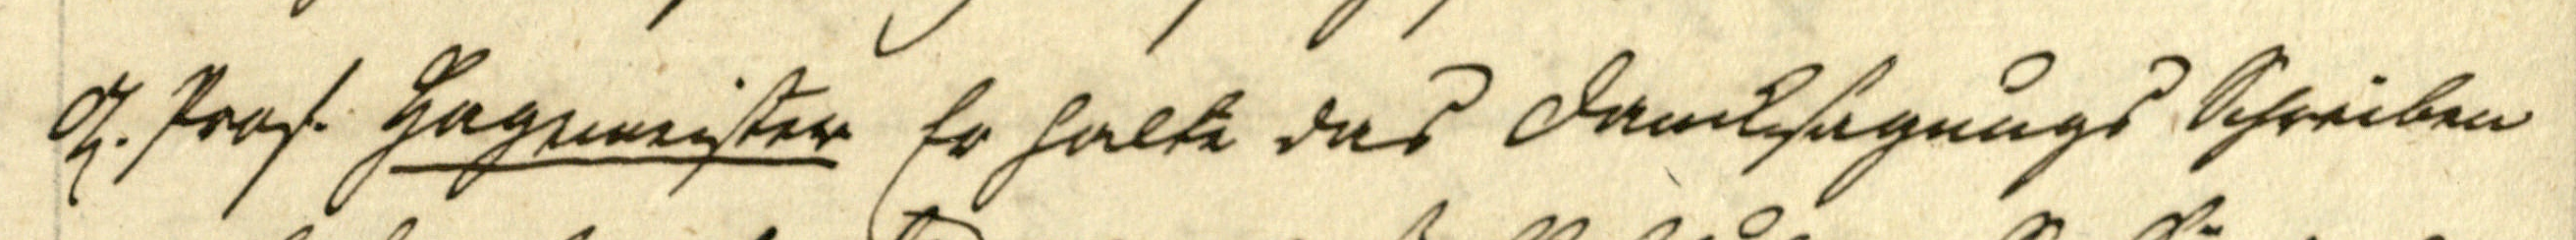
dh. Prof. Hagemeister Er halte das Dancksagungs Schreiben
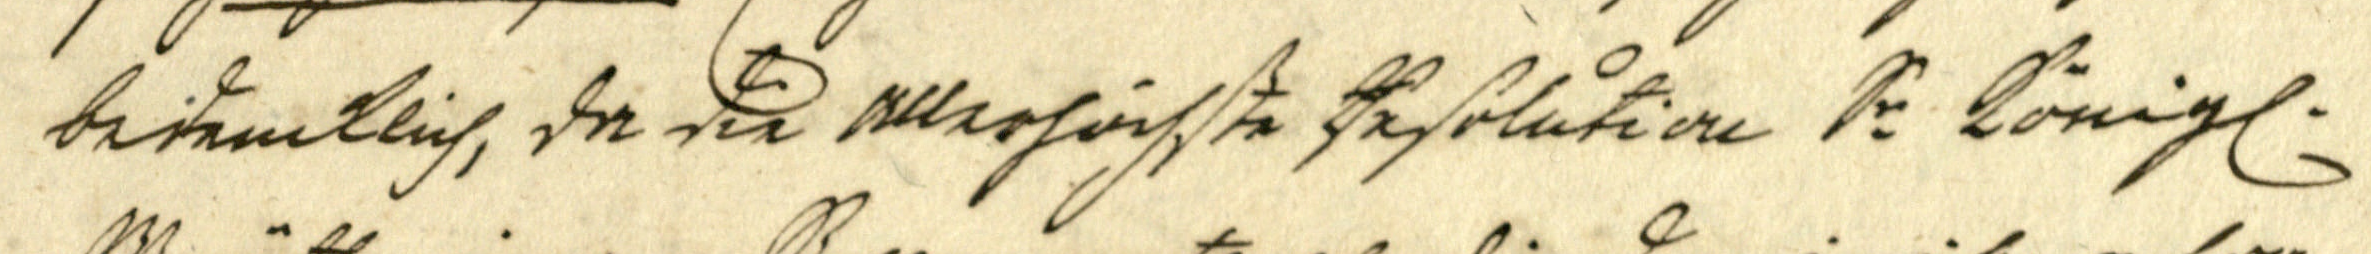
bedencklich, da die Allerhöchste Resolution Sr. Königl.
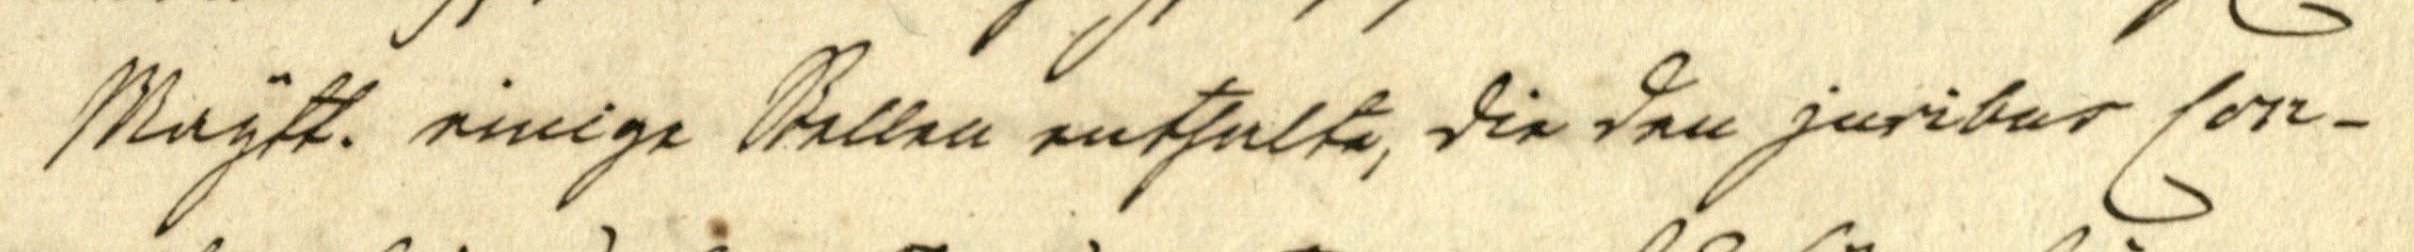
Maÿtt. einige Stellen enthalte, die den juribus Con¬
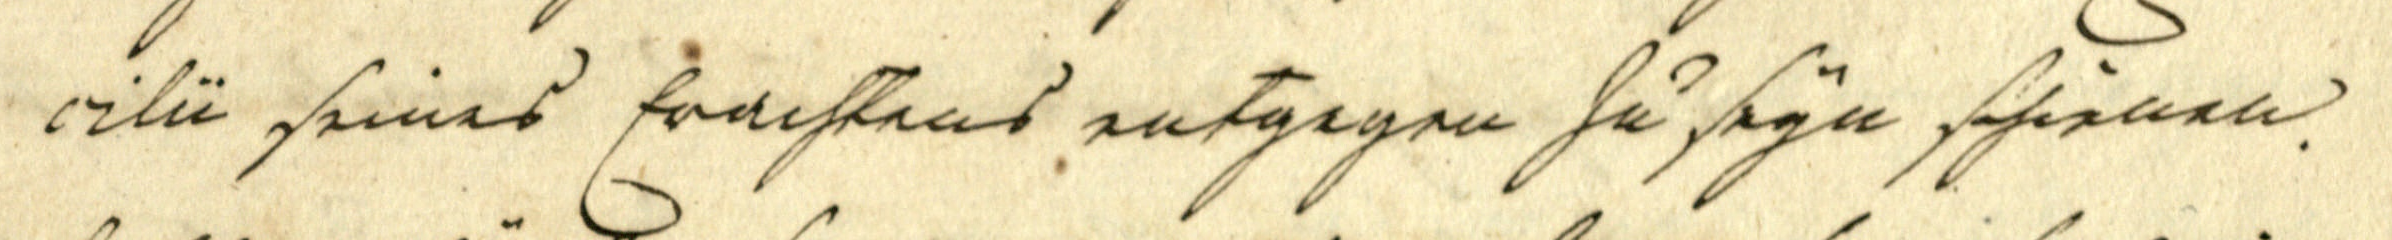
cilii seines Erachtens entgegen zu seÿn schienen.
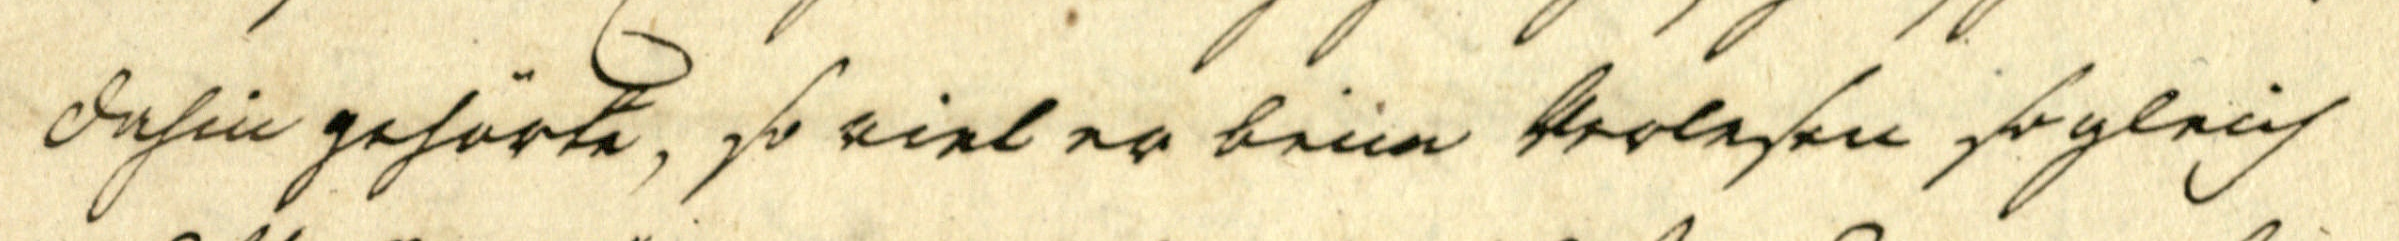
Dahin gehörte, so viel er beim Verlesen so gleich
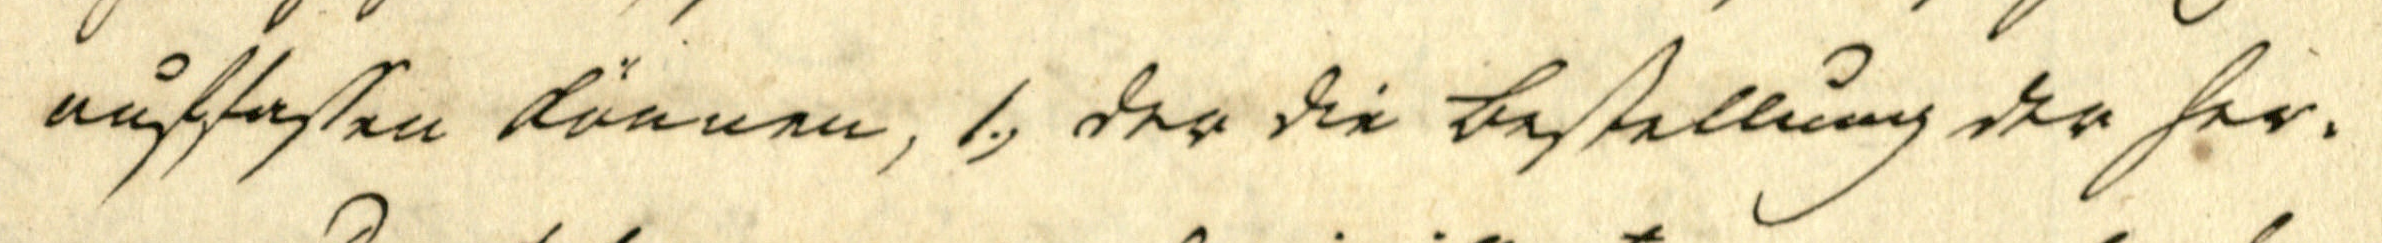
auffassen können, 1., der die Bestellung der Her¬
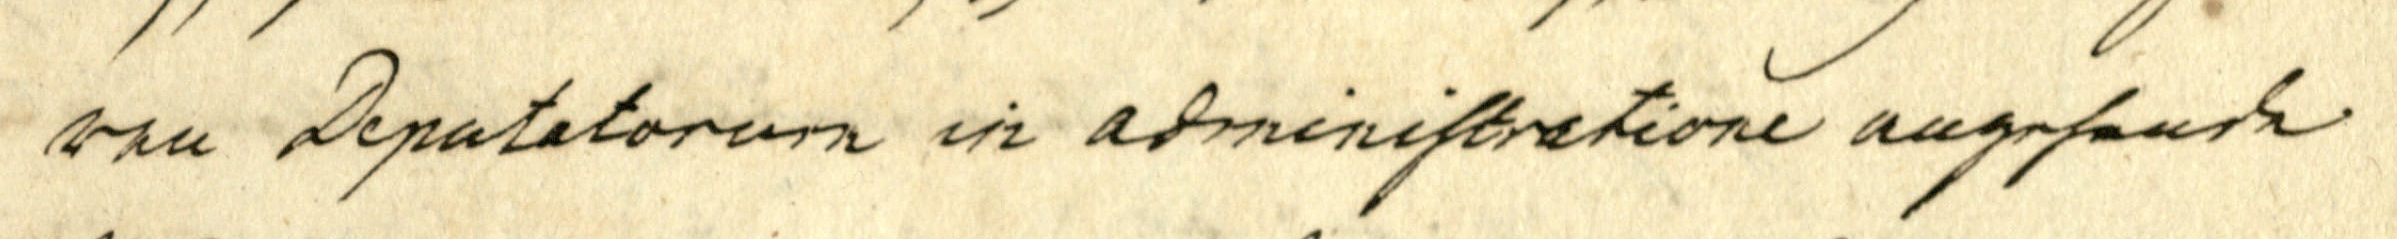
ren Deputatorum in administratione angehende
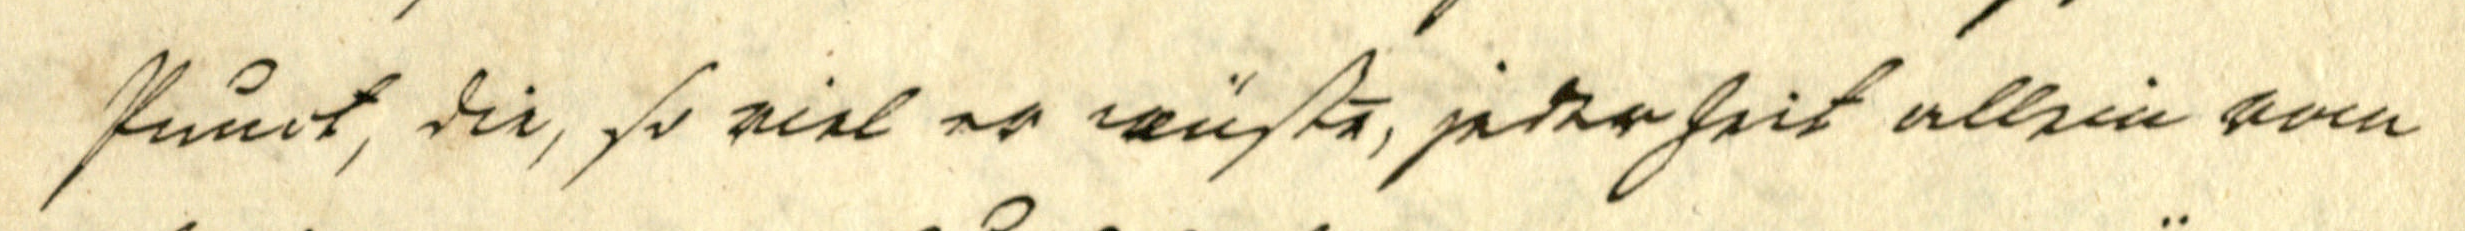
Punct, die, so viel er wüßte, jederzeit allein vom
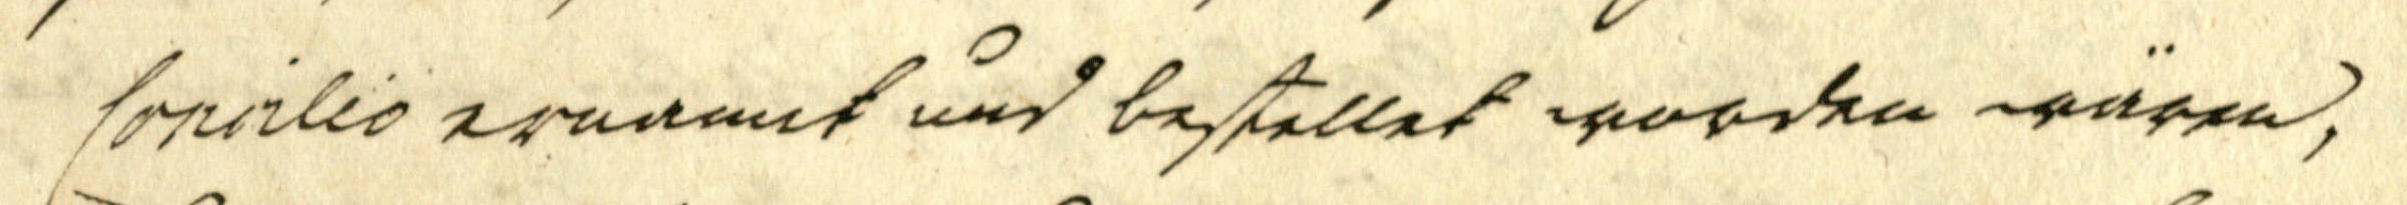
Concilio ernannt und bestellet worden wären,
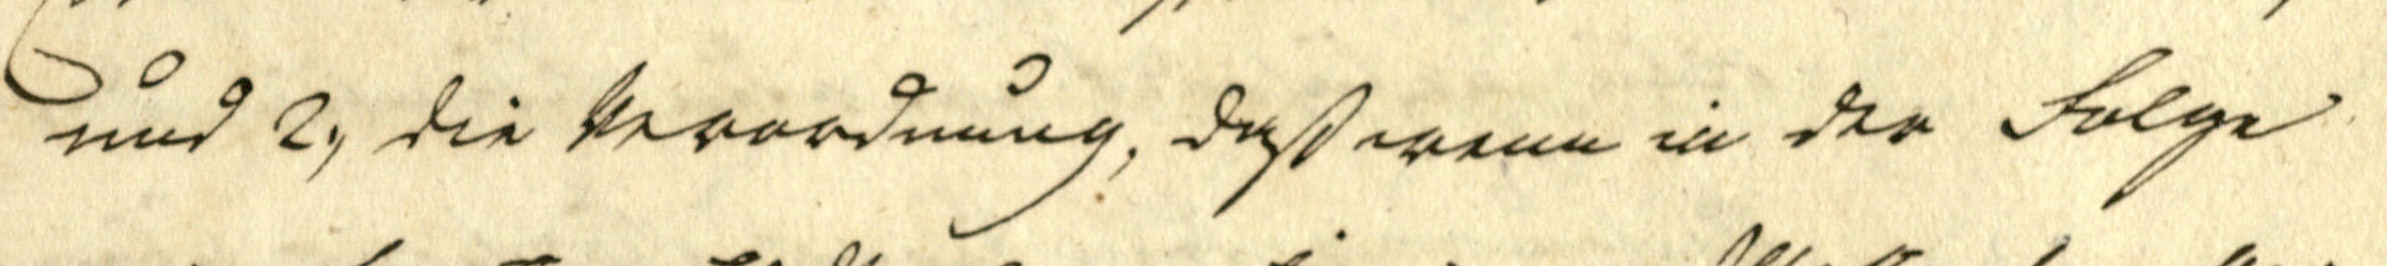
und 2., die Verordnung, daß wenn in der Folge
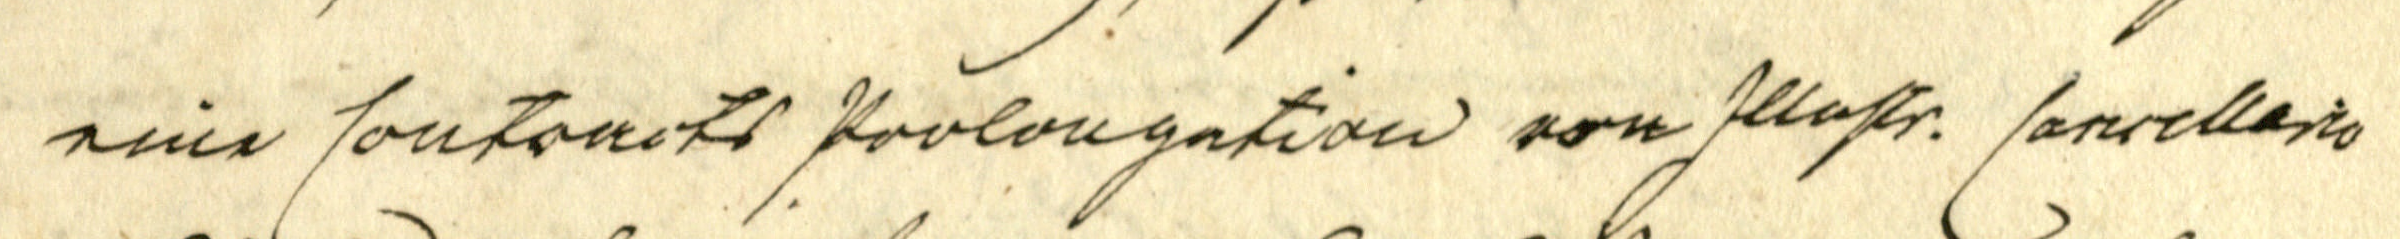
eine Contracts Prolongation von Illustr. Cancellario
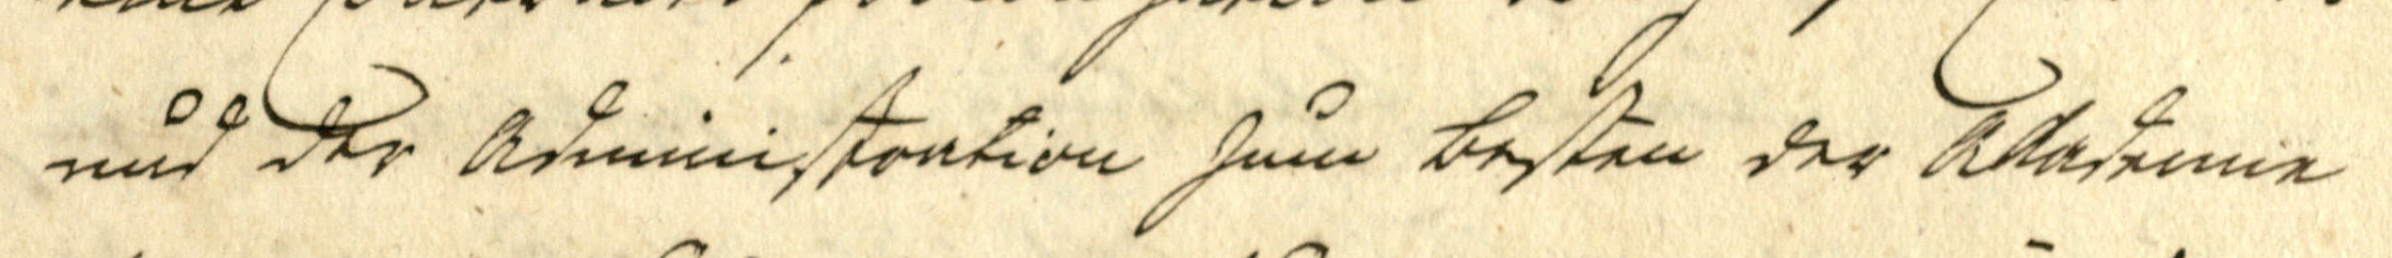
und der Administration zum Besten der Akademie
